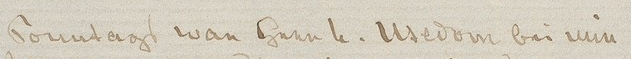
Sonntags war Herr v. Usedom bei mir
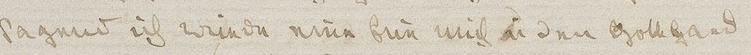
sagend ich würde eine für mich u den Gotthard
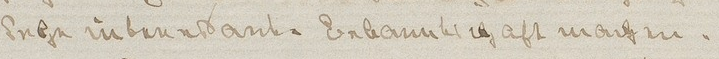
sehr interessante Bekanntschaft machen.
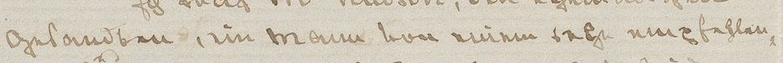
Gesandten, ein Mann von einem sehr empfehlen-
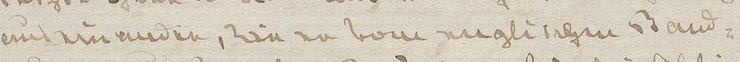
auseinander, wie er vom englischen Stand-
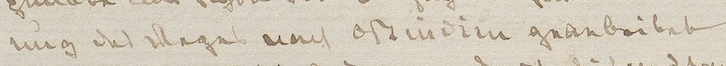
ung des Weges nach Ostindien gearbeitet
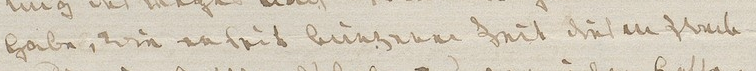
habe, wie er seit kürzerer Zeit diesen Zweck
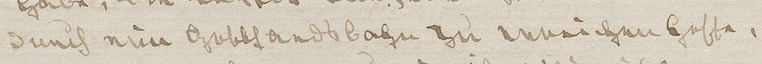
durch eine Gotthardsbahn zu erreichen hoffe,
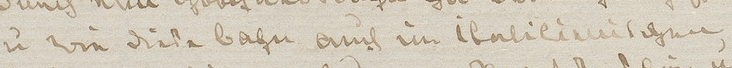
u wie diese Bahn auch im italilienischen
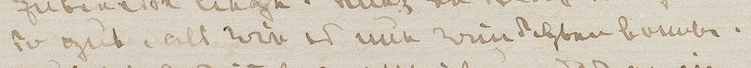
so gut, als wir es nur wünschten konnten.
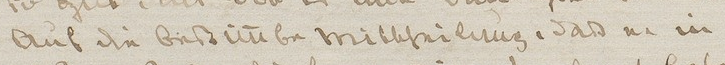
Auf die bestimmte Mittheilung, daß er in
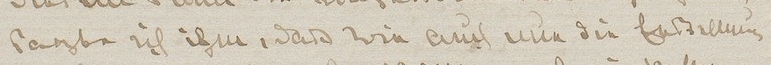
sagte ich ihm, daß wir auch nur die Erstellung
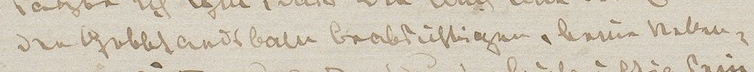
der Gotthardsbahn beabsichtigen, keine Neben-
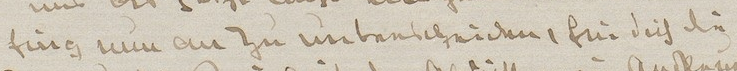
fing nun an zu unterscheiden, für sich die
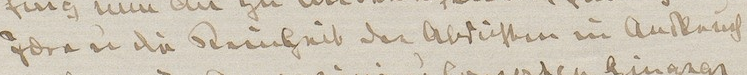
Idee u die Reinheit der Absichten in Anspruch
